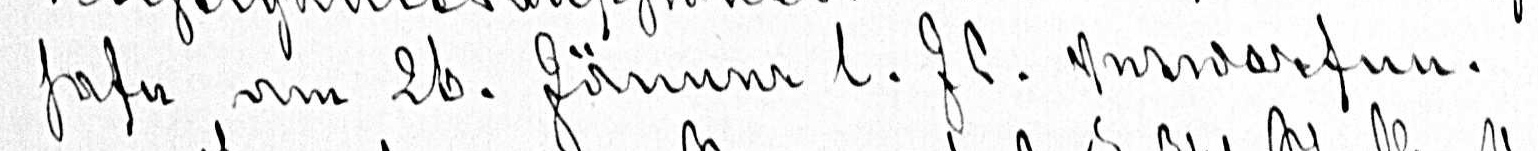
hofe am 16. Jänner l. Js. Verworfen.
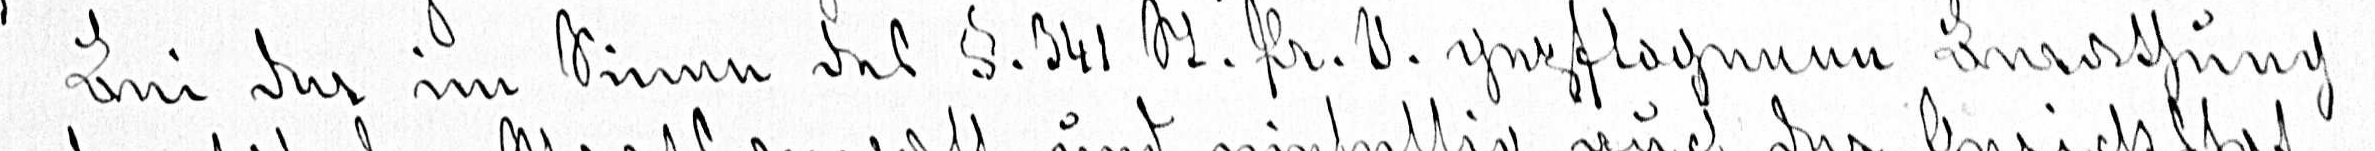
Bei der im Sinne des §341 St Pa V gepflogenen Berathung
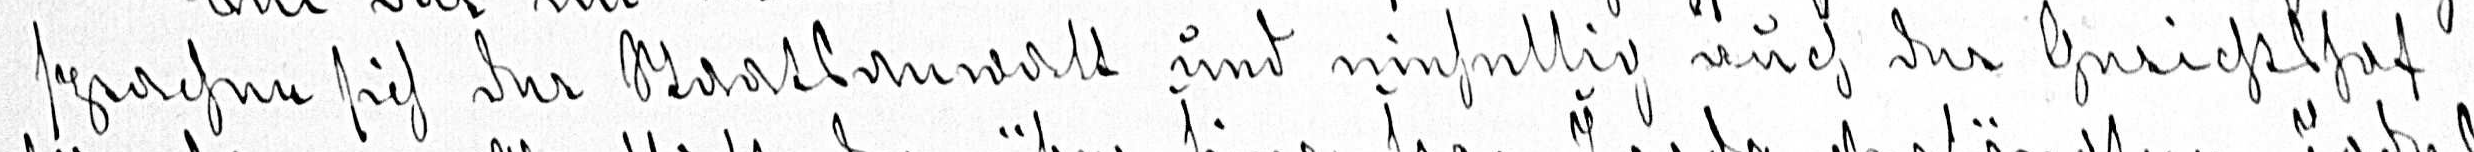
sprachen sich der Staatsanwalt und einhellig auch der Gerichtshof
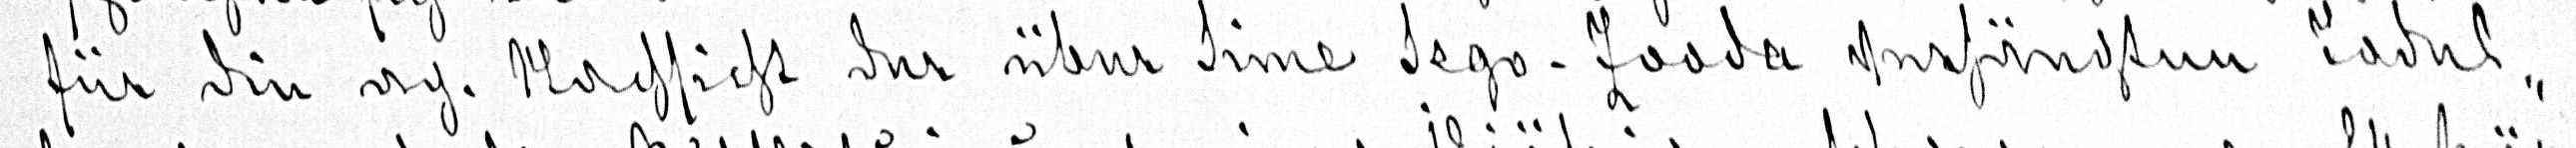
für die ag. Nachsicht der über Šime Šego-Žvoda verhängten Todes¬
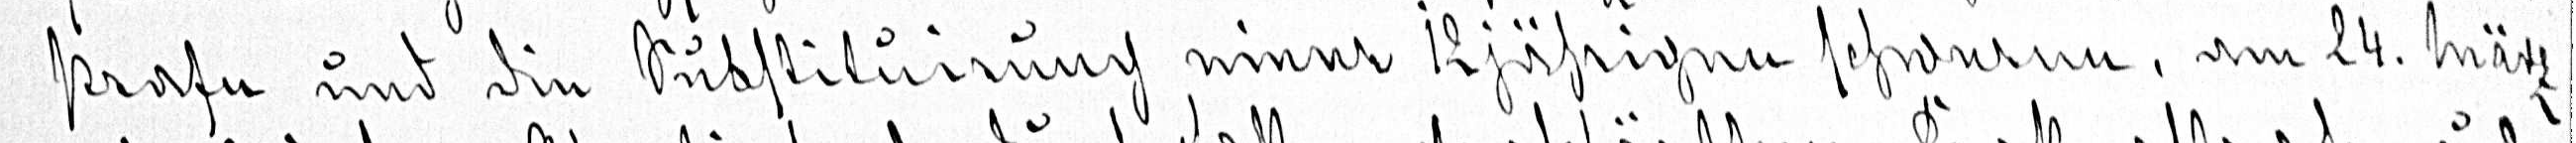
strafe und die Substiuirung einer 12jährigen schweren, am 24. März
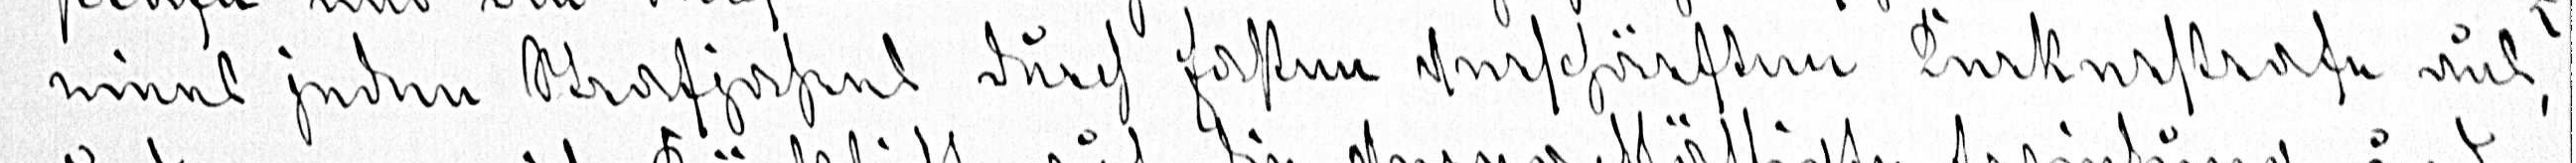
eines jeden Strafjahres durch Fasten verschärften Kerkerstrafe aus
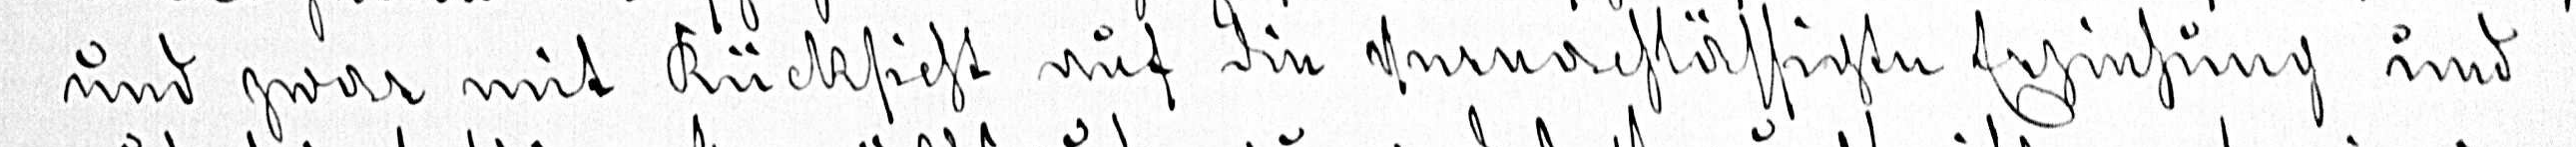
und zwar mit Rücksicht auf die vernachlässigte Erziehung und
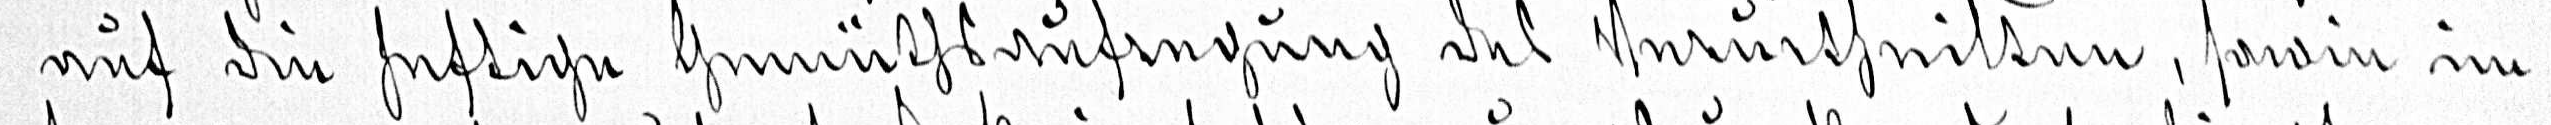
auf die heftige Gemüthsaufregung des Verurtheilten, sowie in
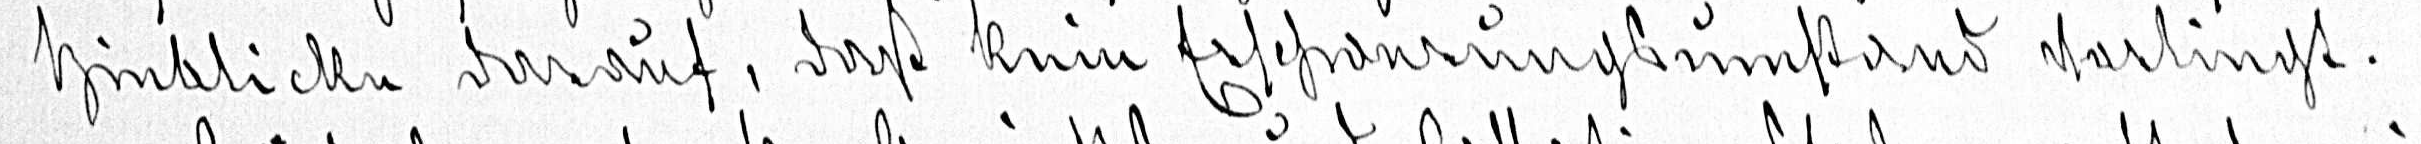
Hinblicke darauf, daß kein Erschwerungsumstand vorliegt.
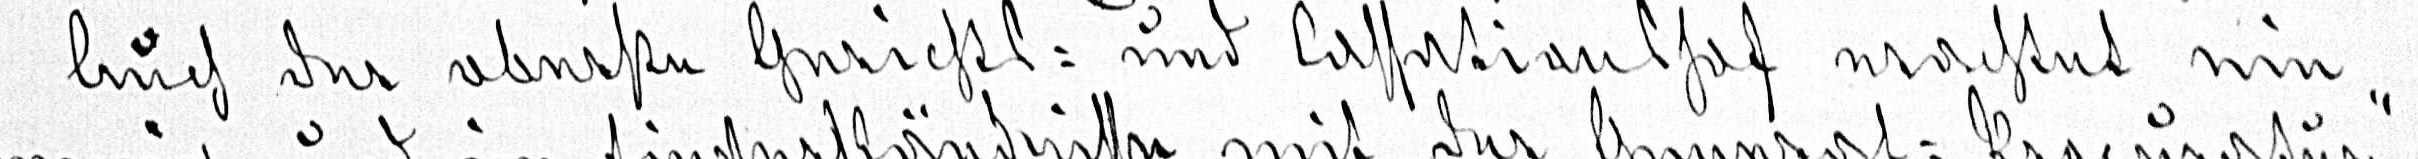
Auch der oberste Gerichts- und Cassationshof erachtet ein¬
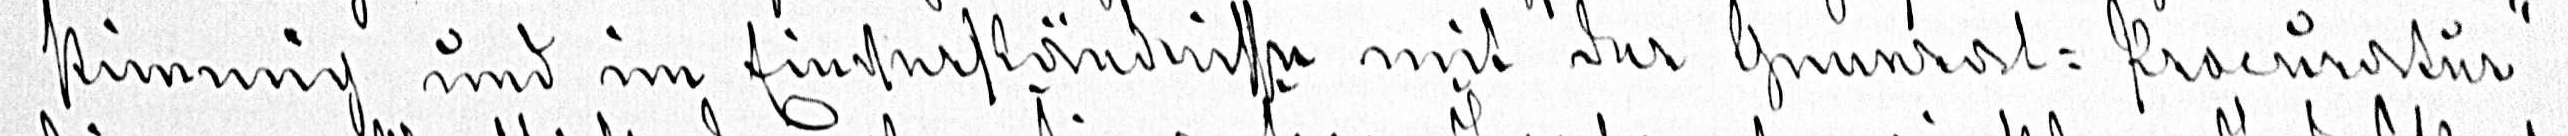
stimmig und im Einverständnisse mit der General-Procuratur
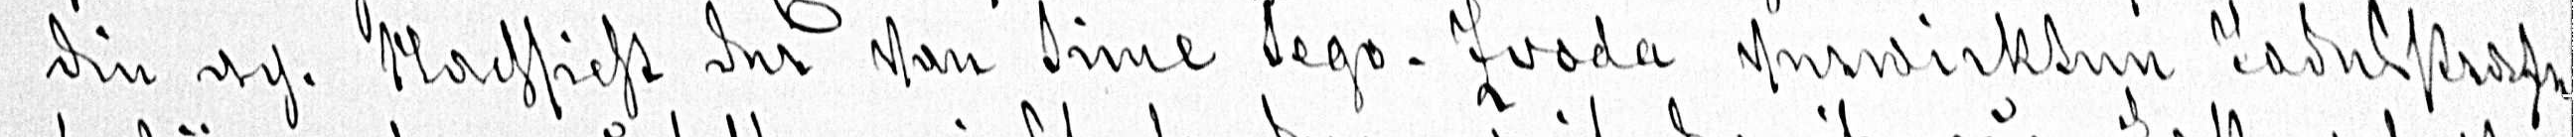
die ag. Nachsicht der von Šime Šego-Žvoda verwirkten Todesstrafe
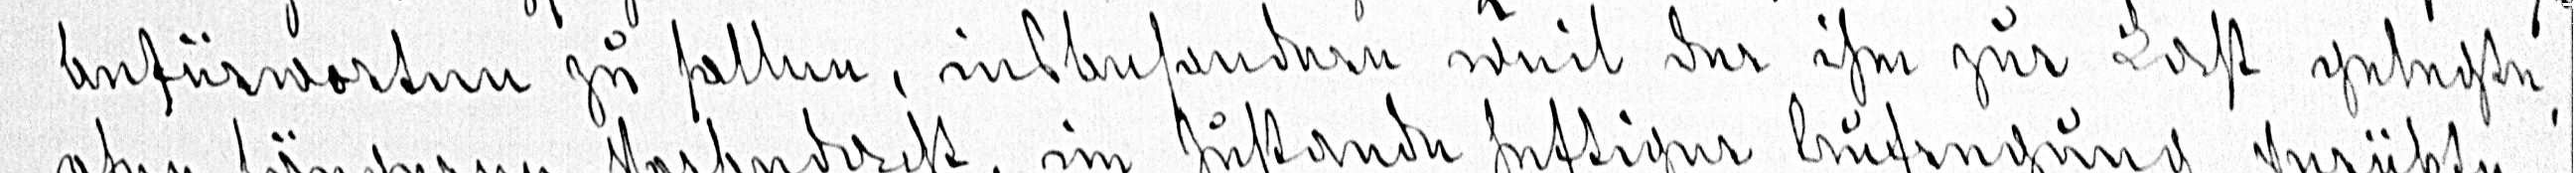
befürworten zu sollen, insbesondere weil der ihm zur Last gelegte,
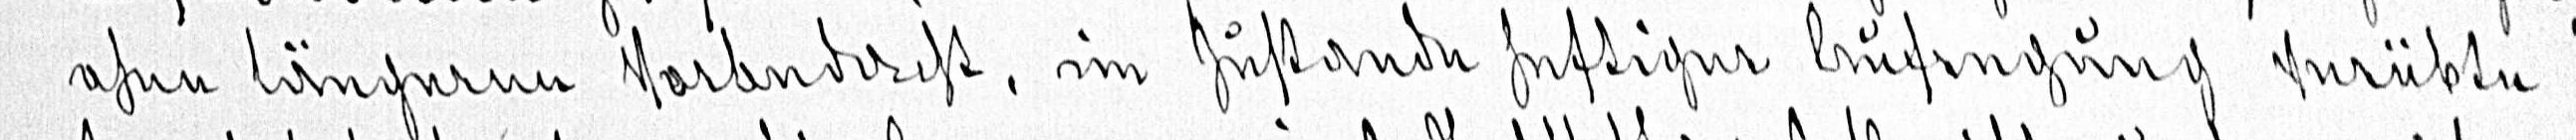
ohne längeren Vorbedacht, im Zustande heftiger Aufregung verübte
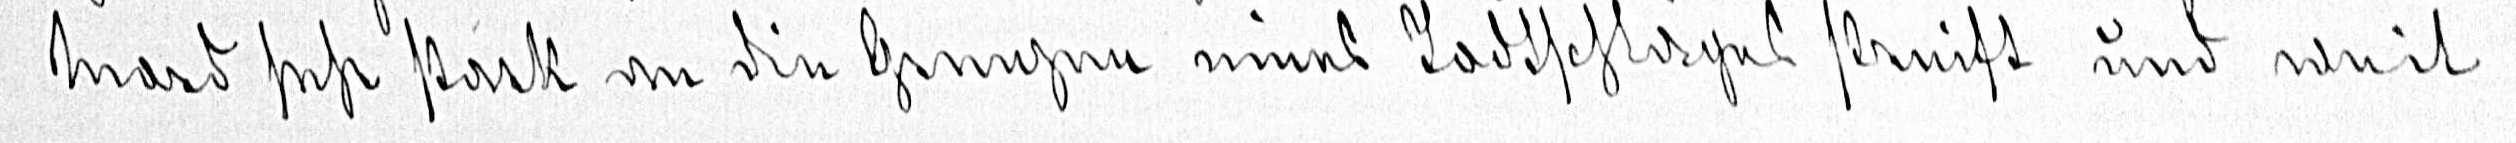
Mord sehr stark an die Gewogen eines Todtschlages streift und weil
